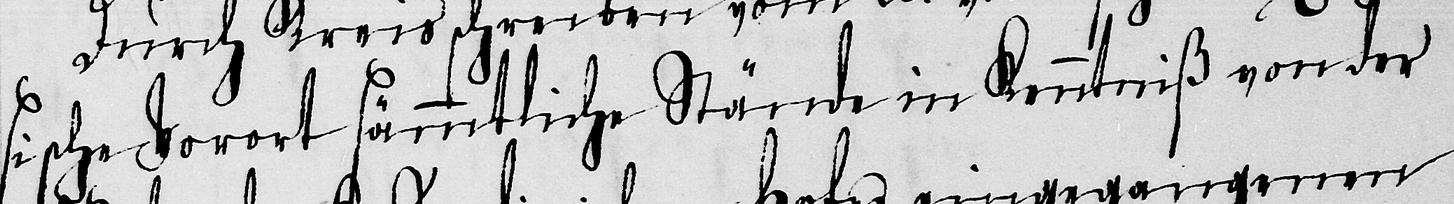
ische Vorort sämmtliche Stände in Kenntniß von der
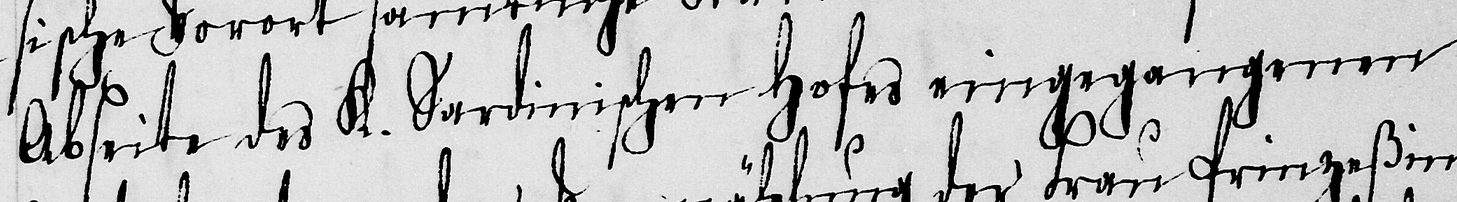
Abseite des K. Sardinischen Hofes eingegangenen
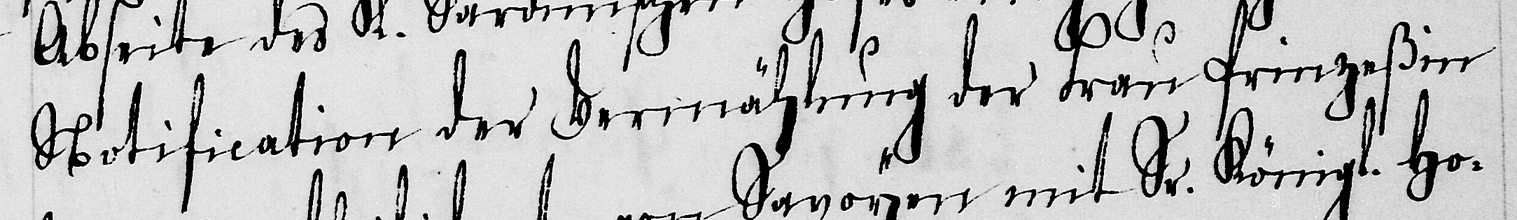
Notification der Vermählung der Frau Prinzeßin
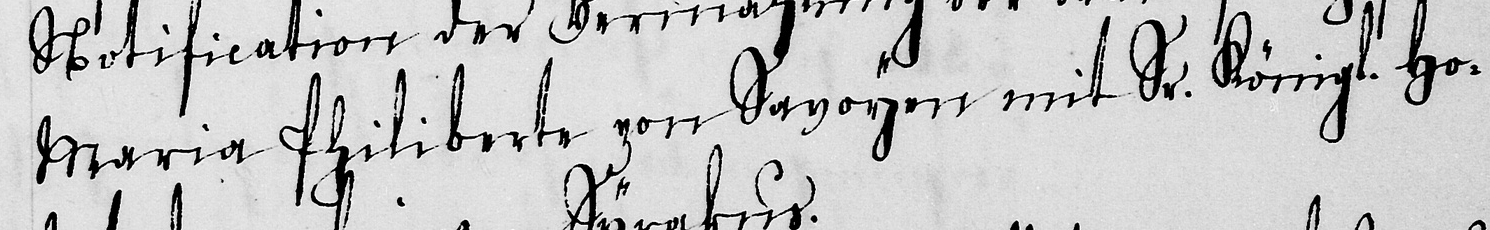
Maria Philiberte von Savoyen mit Sr. Königl. Hoh¬
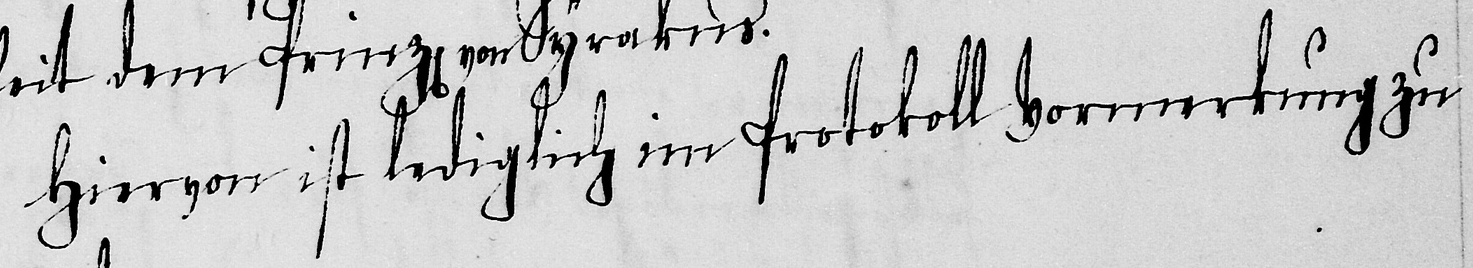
Hiervon ist lediglich im Protokoll Vormerkung zu
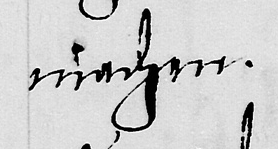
machen.
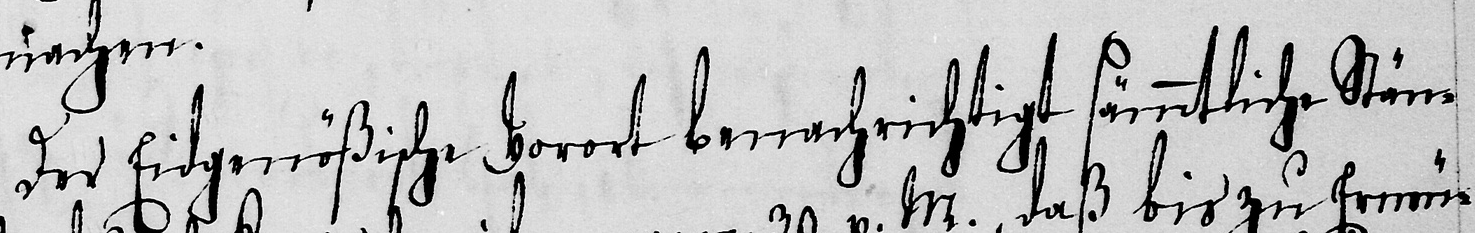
Der Eidgenößische Vorort benachrichtigt sämmtliche Stän¬
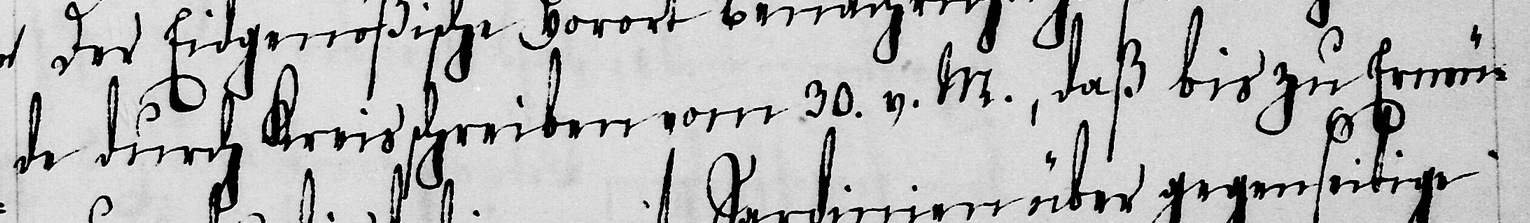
de durch Kreisschreiben vom 30. v. M., daß bis zu Erneu¬
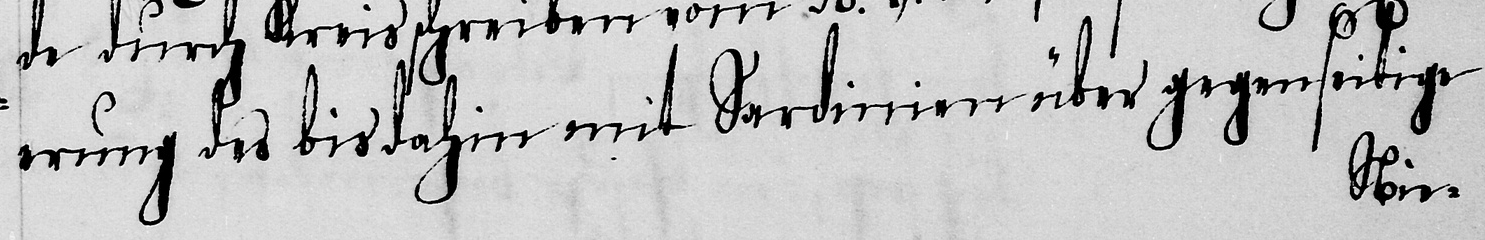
erung des bis dahin mit Sardinien über gegenseitige
